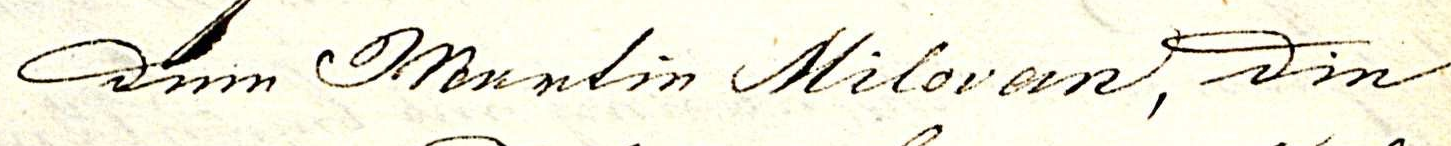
dem Martin Milovan, die
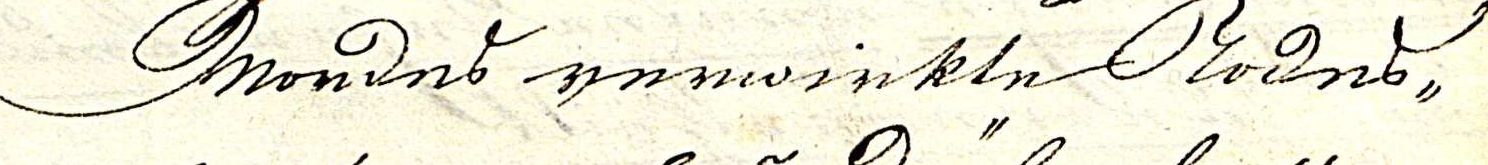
Mordes verwirkte Rodes¬
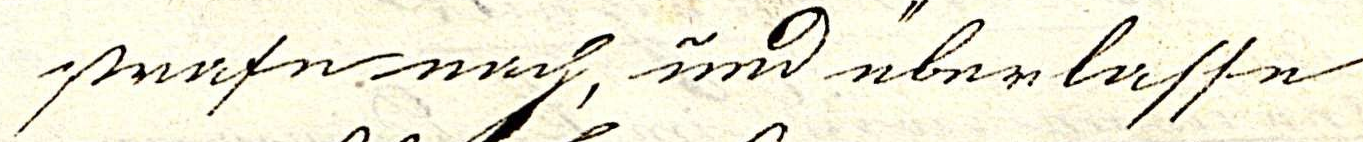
strafe nach, und über lasse
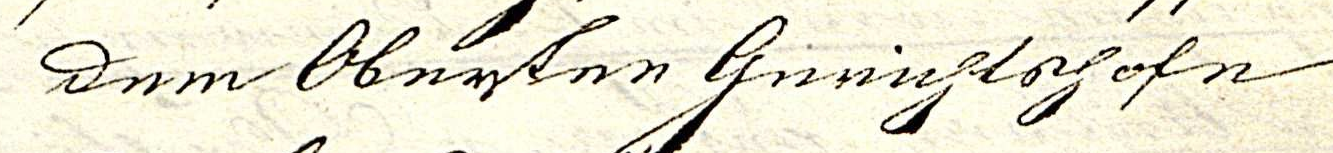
dem Oberten Gerichtshofe
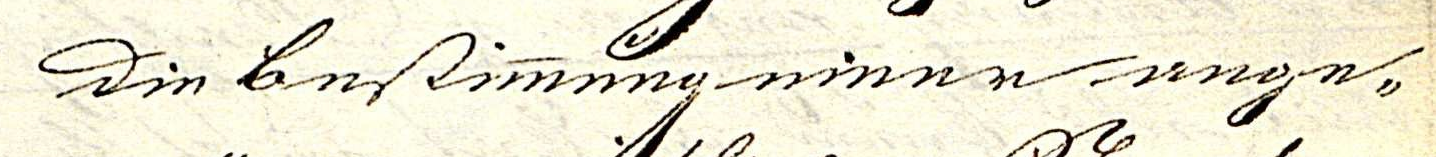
die Bestimmung einer ange¬
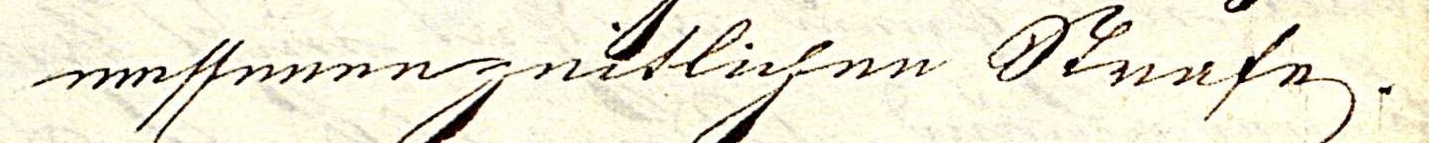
messenen zeitlichen Strafe.
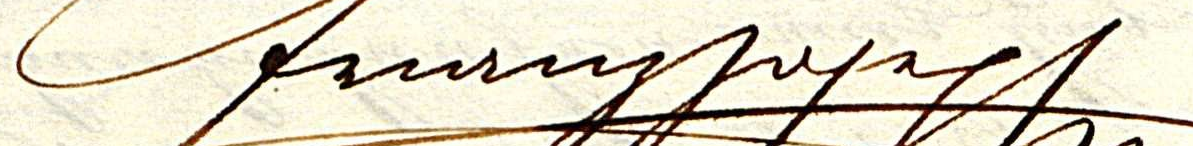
Franz Josef xx
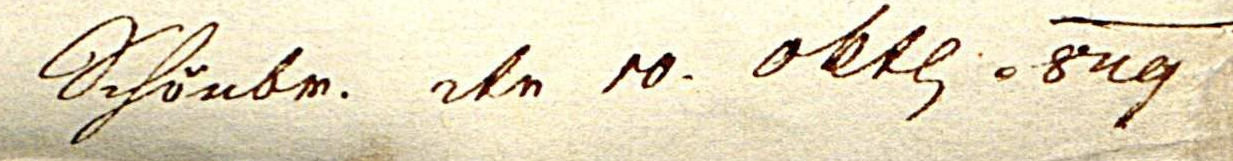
Schönbr. den 10. Okt. 849.
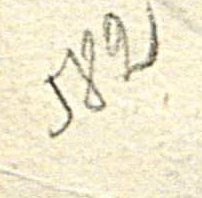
582
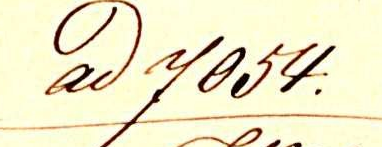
ad 7054.
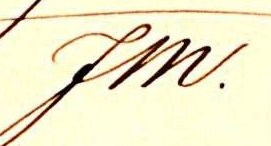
IM.
